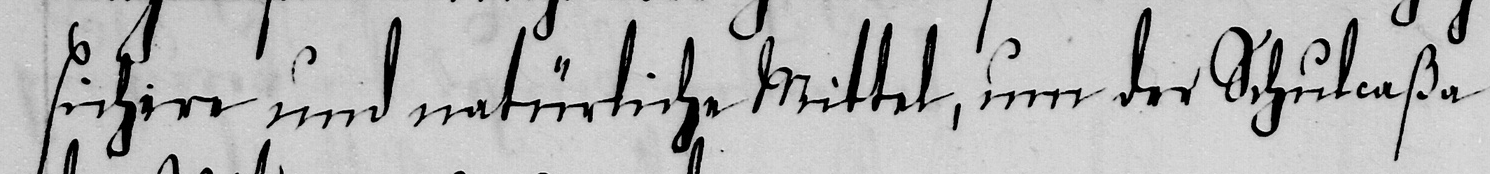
sichere und natürliche Mittel, um der Schulcaßa
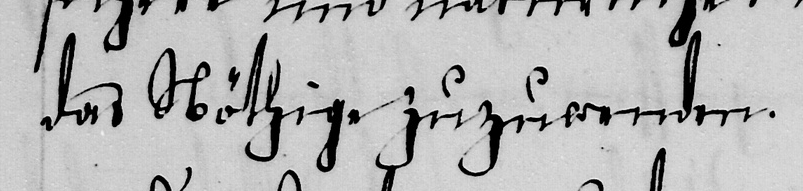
das Nöthige zuzuwenden.
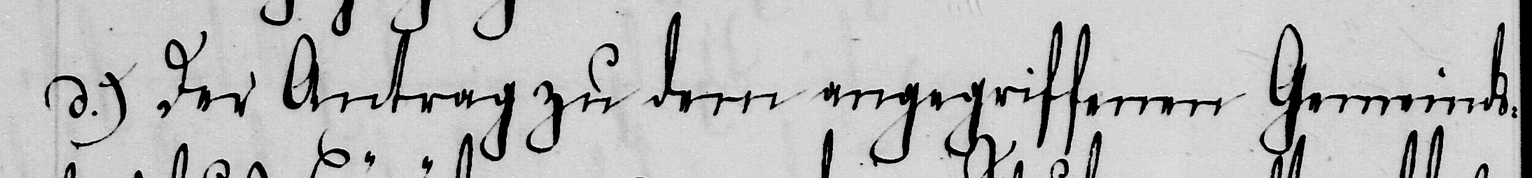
d.) Der Antrag zu dem angegriffenen Gemeinds¬
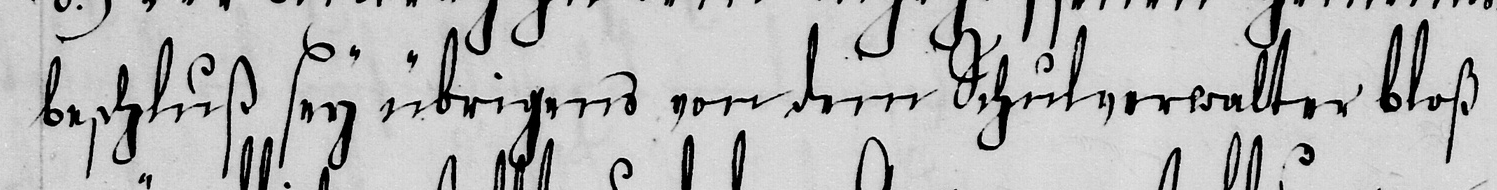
beschluß sey übrigens von dem Schulverwalter bloß
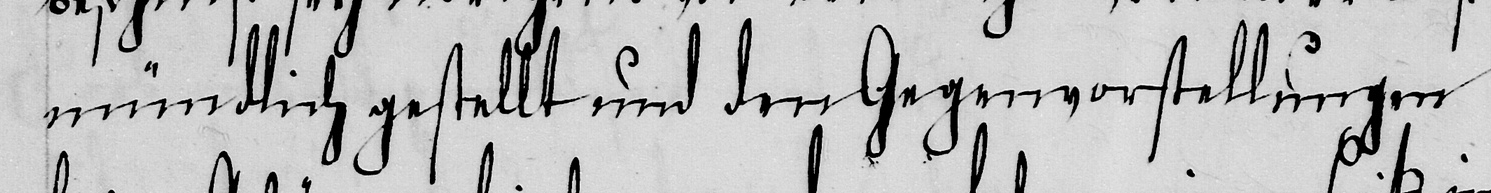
mündlich gestellt und den Gegenvorstellungen
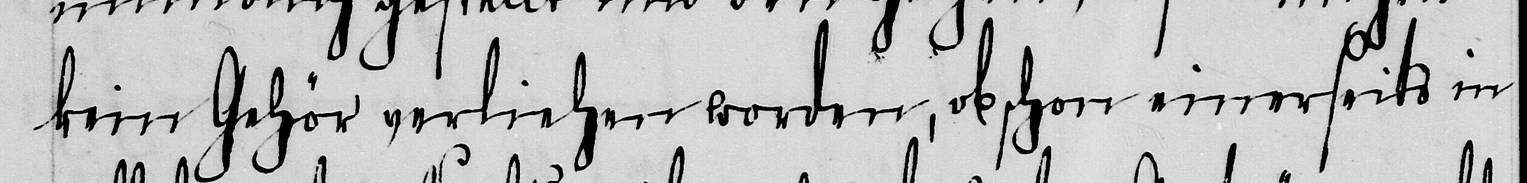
kein Gehör verliehen worden, obschon einerseits in
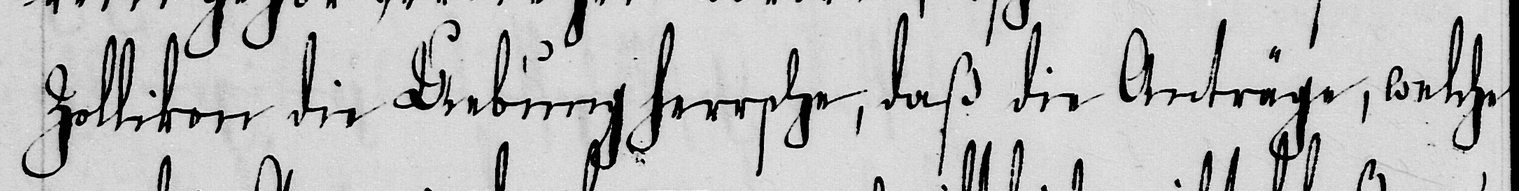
Zollikon die Uebung herrsche, daß die Anträge, welche
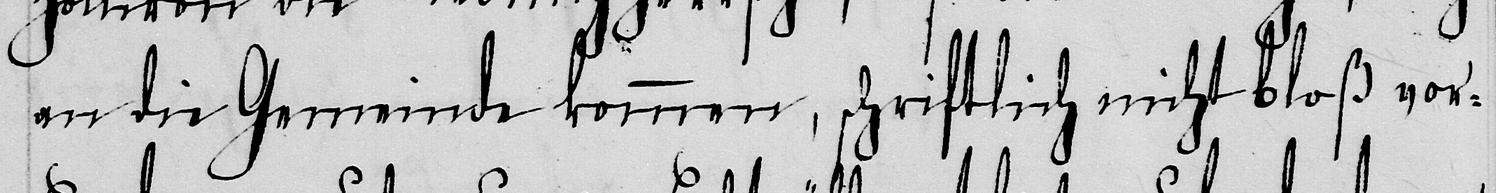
an die Gemeinde kommen, schriftlich nicht bloß vor¬
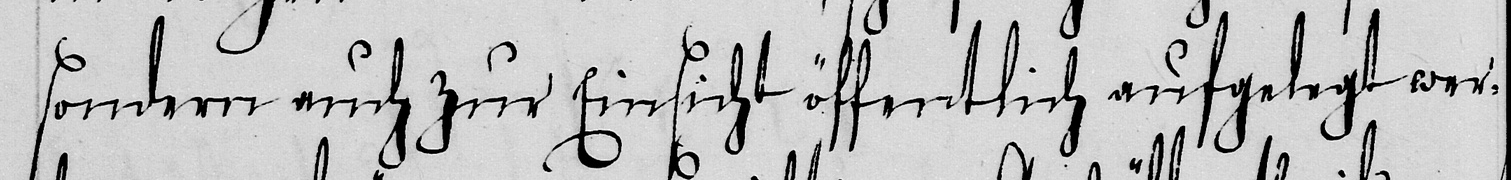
sondern auch zur Einsicht öffentlich aufgelegt wer¬
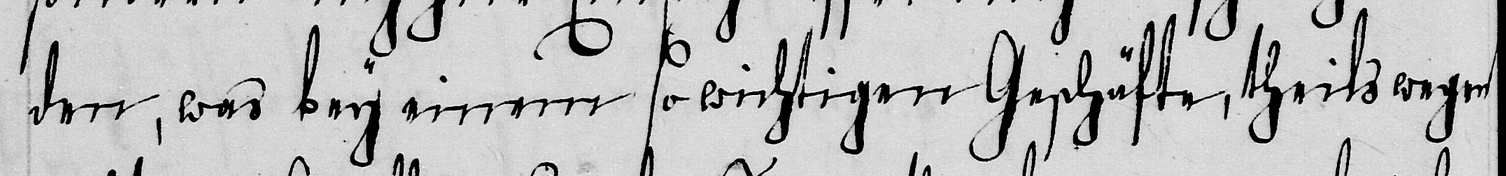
den, was bey einem so wichtigen Geschäfte, theils wegen
